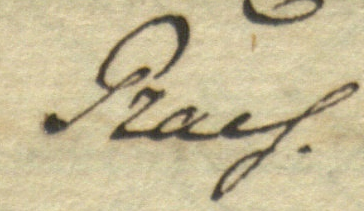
Praes.
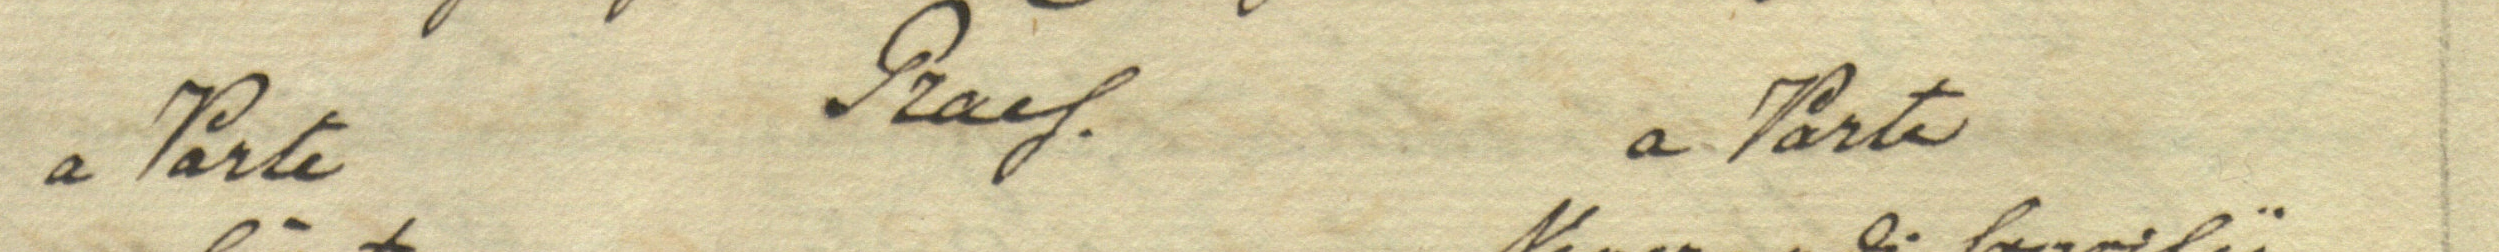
a Parte a Parte
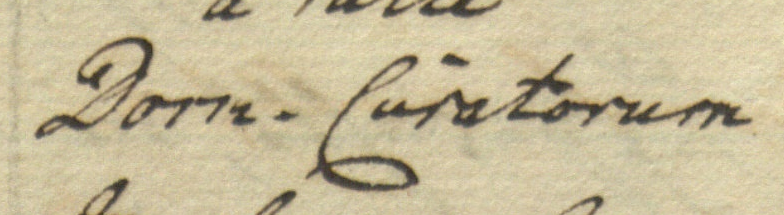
Dom. Curatorum
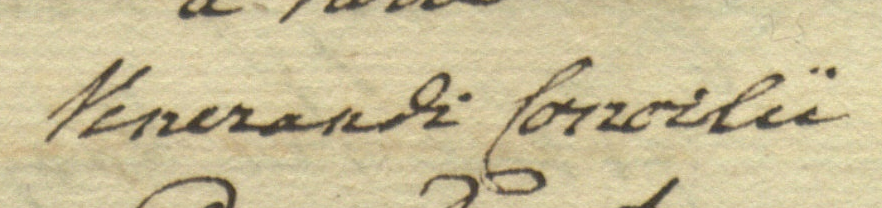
Venerandi Concilii
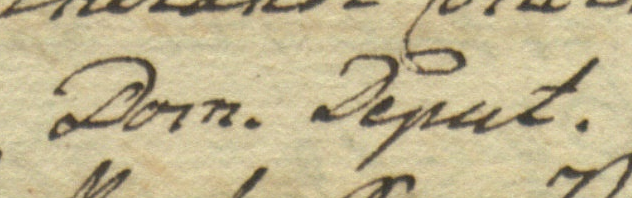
Dom. Deput.
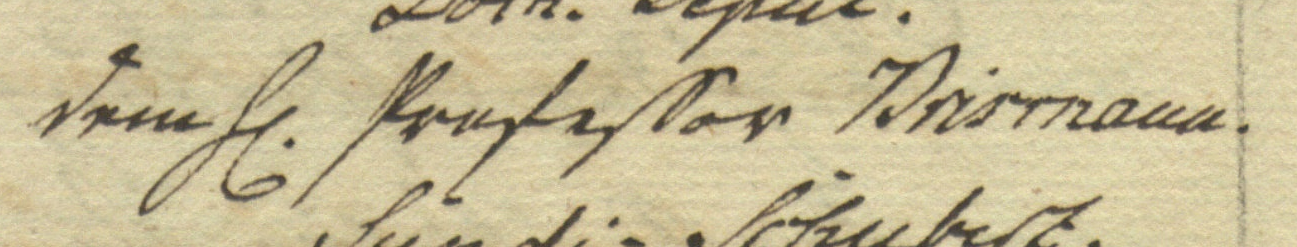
dem h. Professor Brismann.
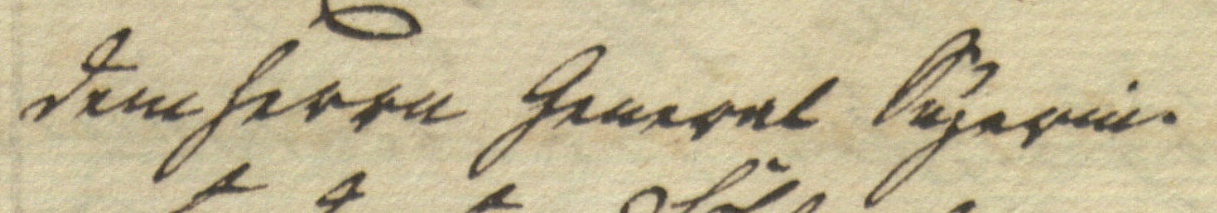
dem Herrn General Superin¬
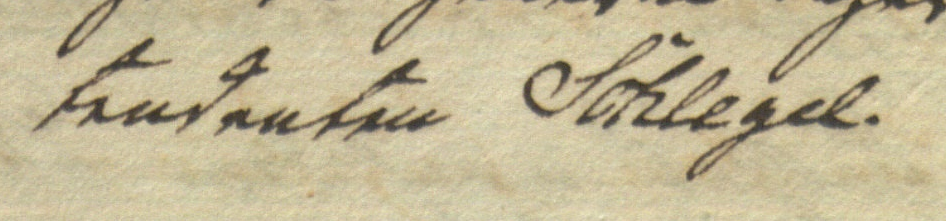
tendenten Schlegel.
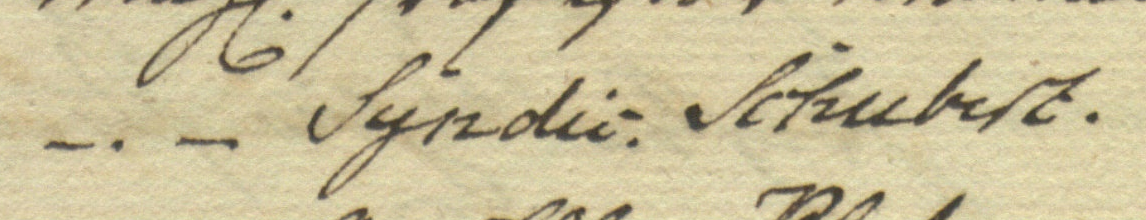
Sÿndic. Schubert.
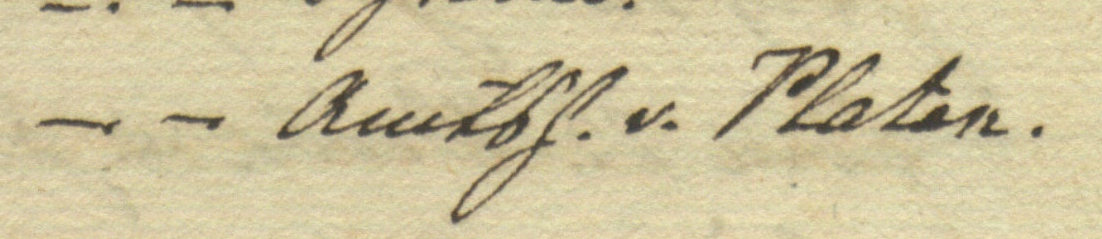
Amtsh. v. Platen.
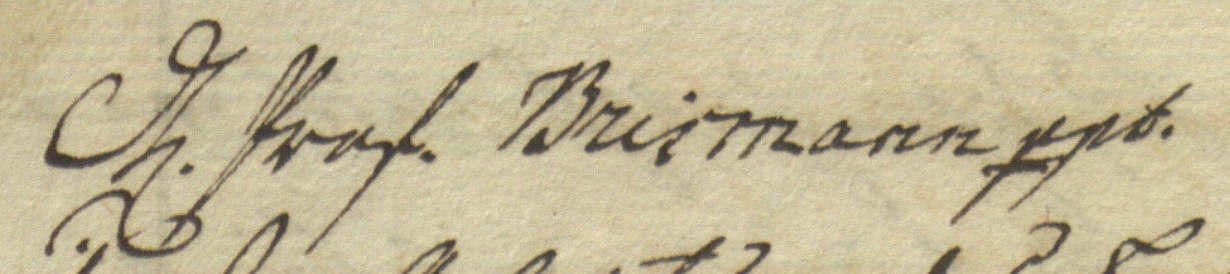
dh. Prof. Brimann ppt.
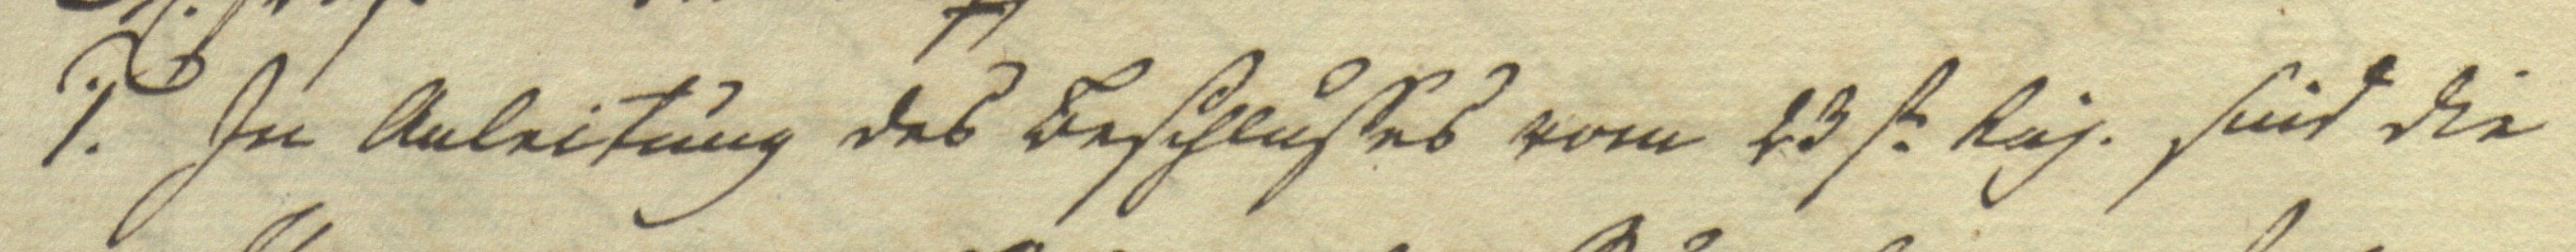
1. In Anleitung des Beschlusses vom 23 st huj. sind die
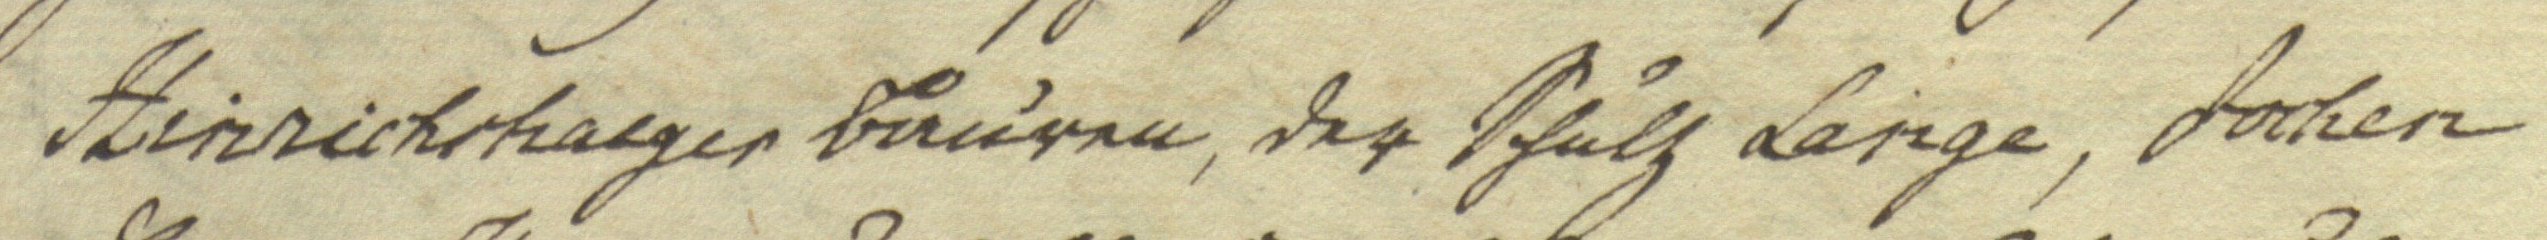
Hinrichshaeger Bauren, der Schulz Lange, Jochen
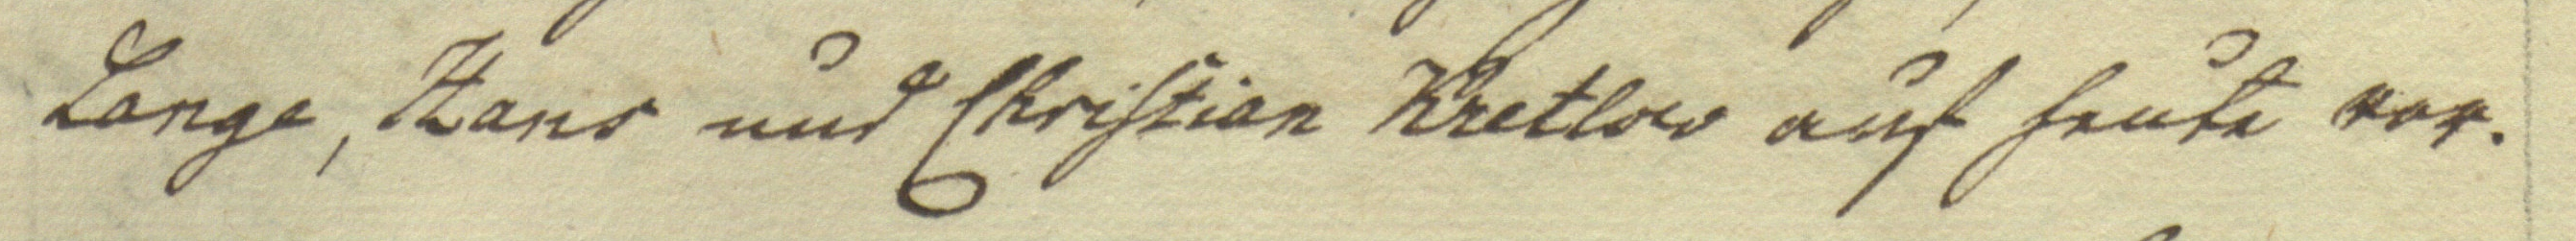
Lange, Hans und Christian Kretlow auf heute vor¬
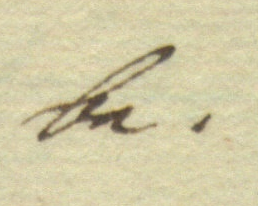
be¬
